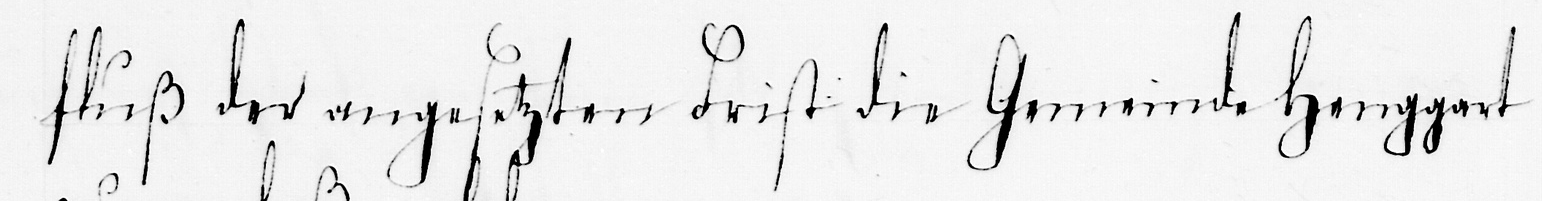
fluß der angesetzten Frist die Gemeinde Henggart
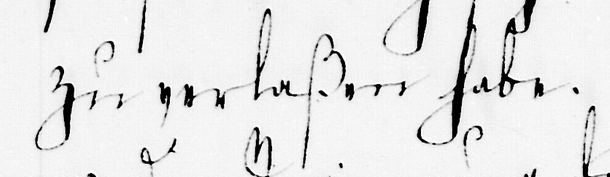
zu verlaßen habe.
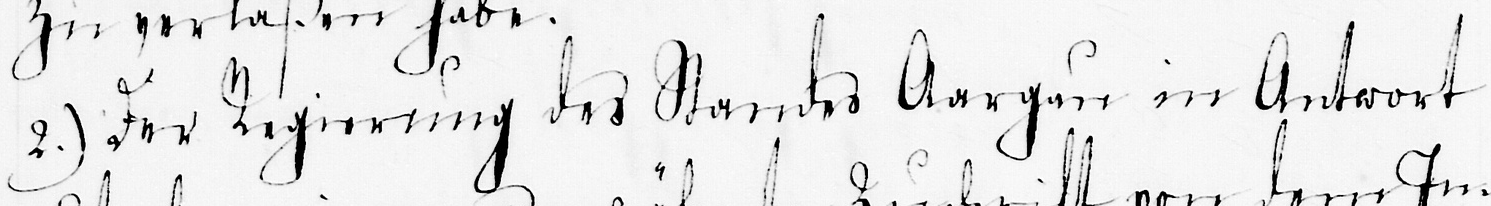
2.) Der Regierung des Standes Aargau in Antwort
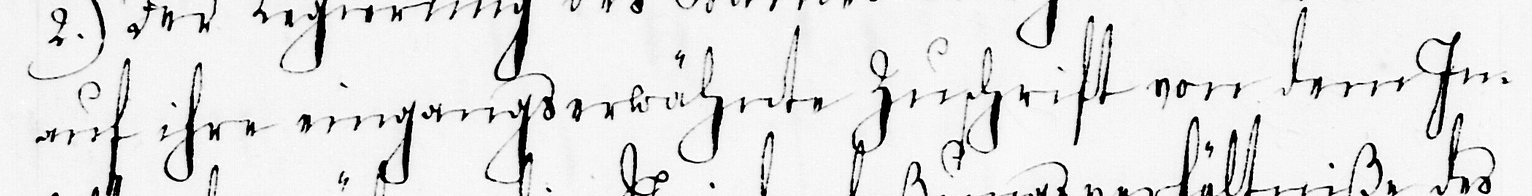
auf ihre eingangserwähnte Zuschrift von dem In¬
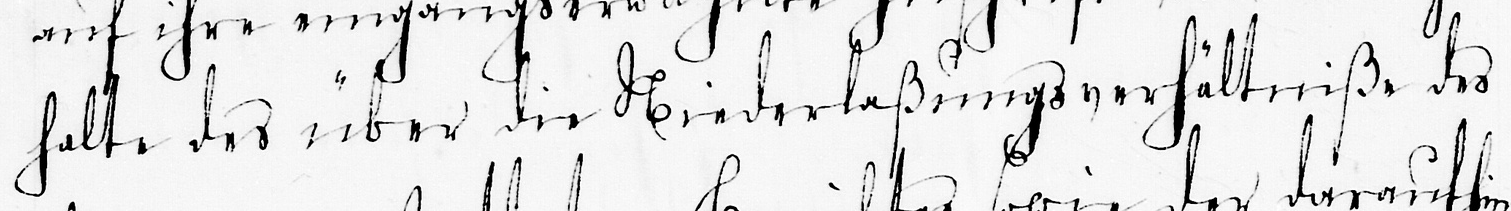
halte des über die Niederlaßungsverhältniße des
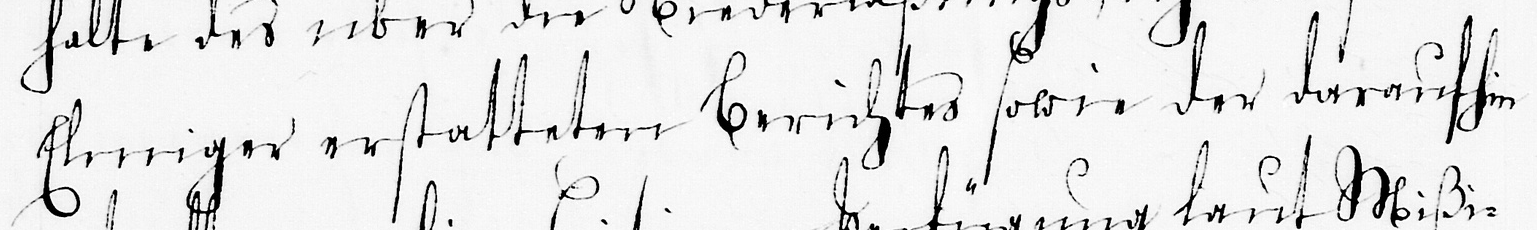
Elmiger erstatteten Berichtes sowie der daraufhin
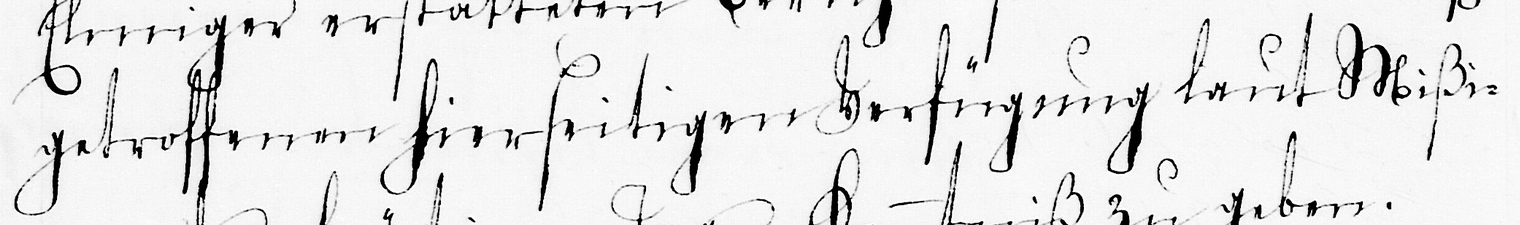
getroffenen hierseitigen Verfügung laut Mißi¬
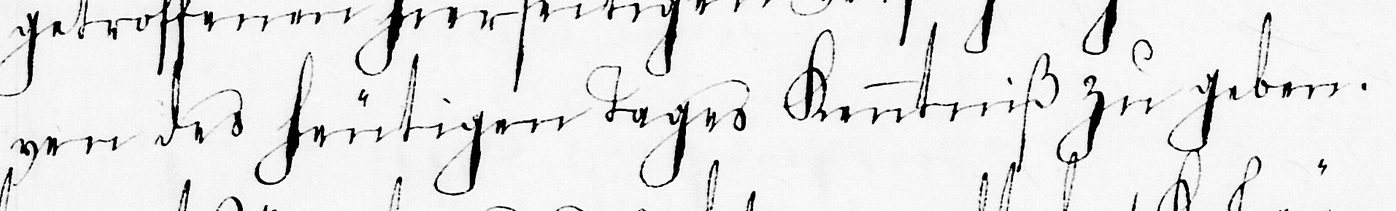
ven des heutigen Tages Kenntniß zu geben.
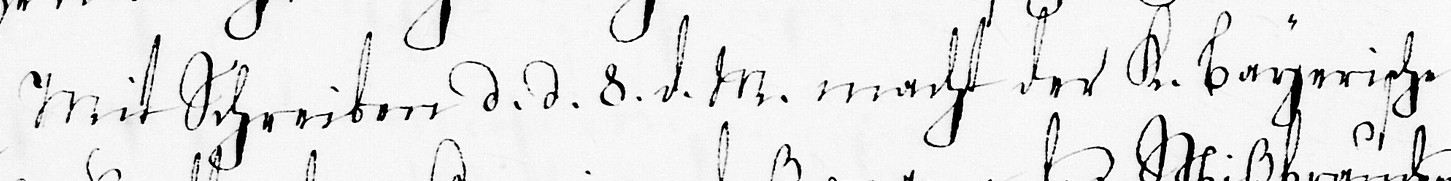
Mit Schreiben d. d. 8. d. M. macht der K. Bayerische
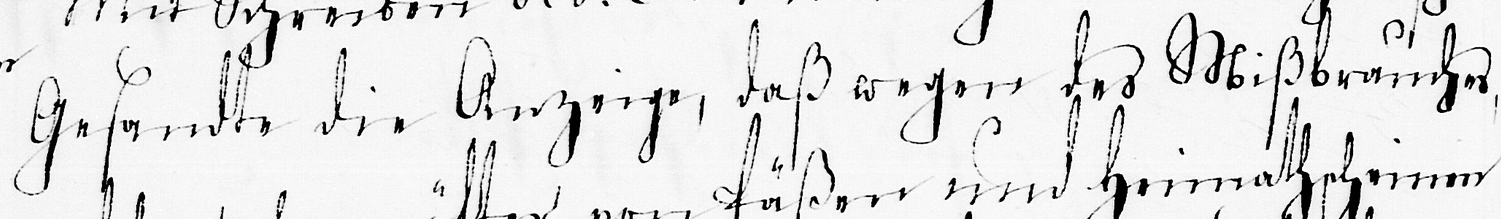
Gesandte die Anzeige, daß wegen des Mißbrauches,
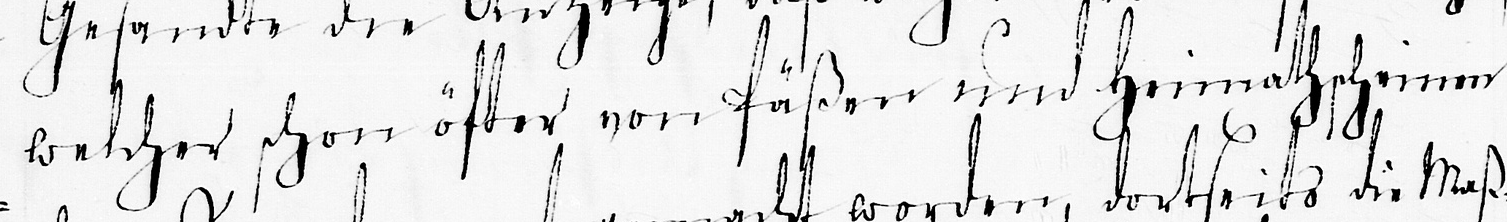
welcher schon öfter von Päßen und Heimathscheinen
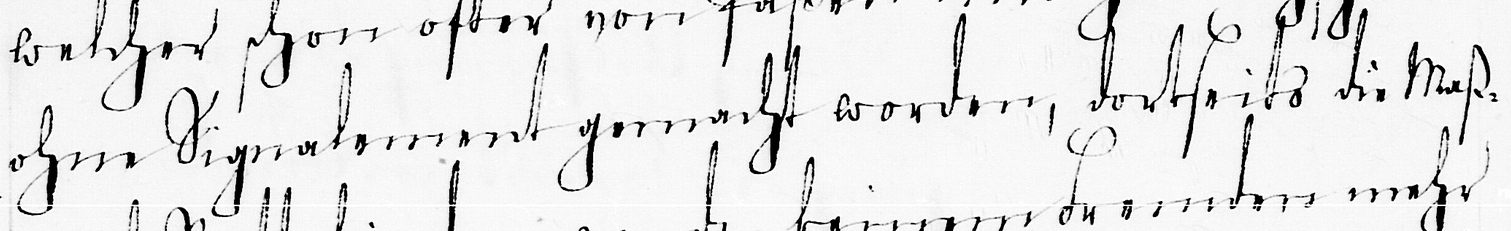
ohne Signalement gemacht worden, dortseits die Maß¬
